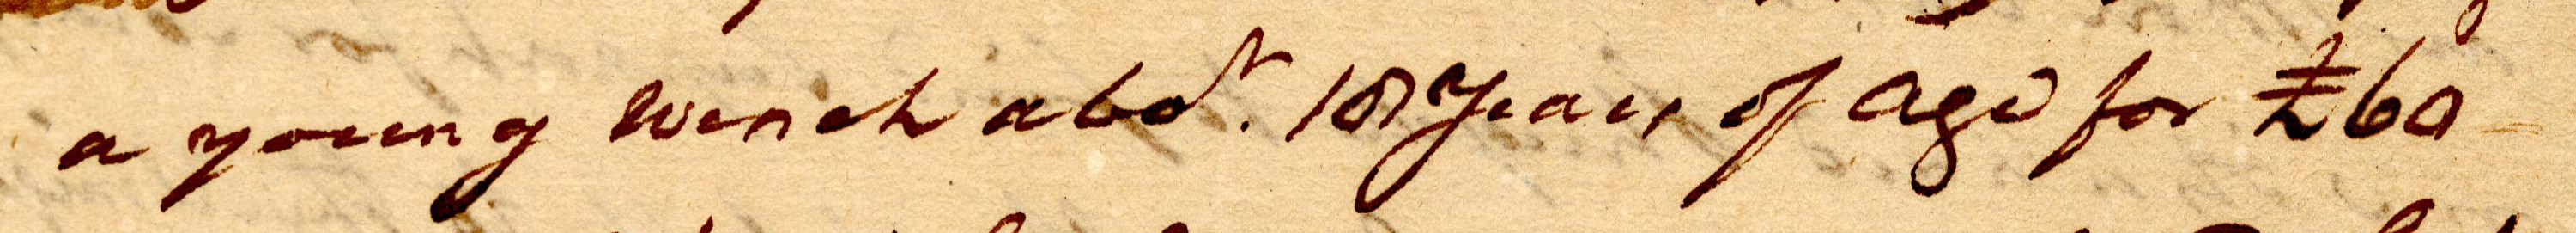a young wench abo^t. 10 years of age for £60
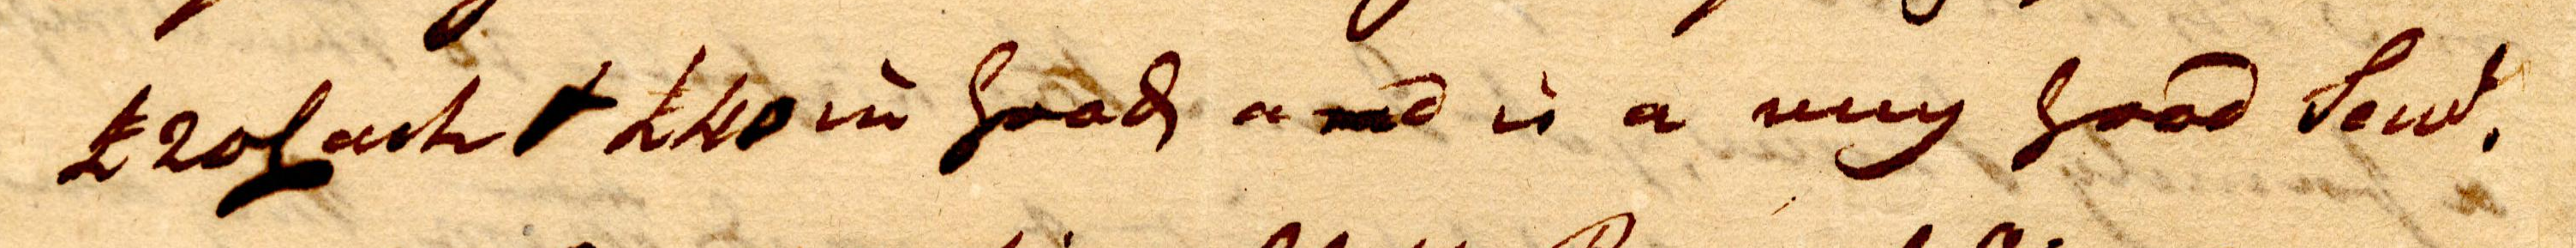£20 Cash & £40 in goods, and is a very good Ser^t
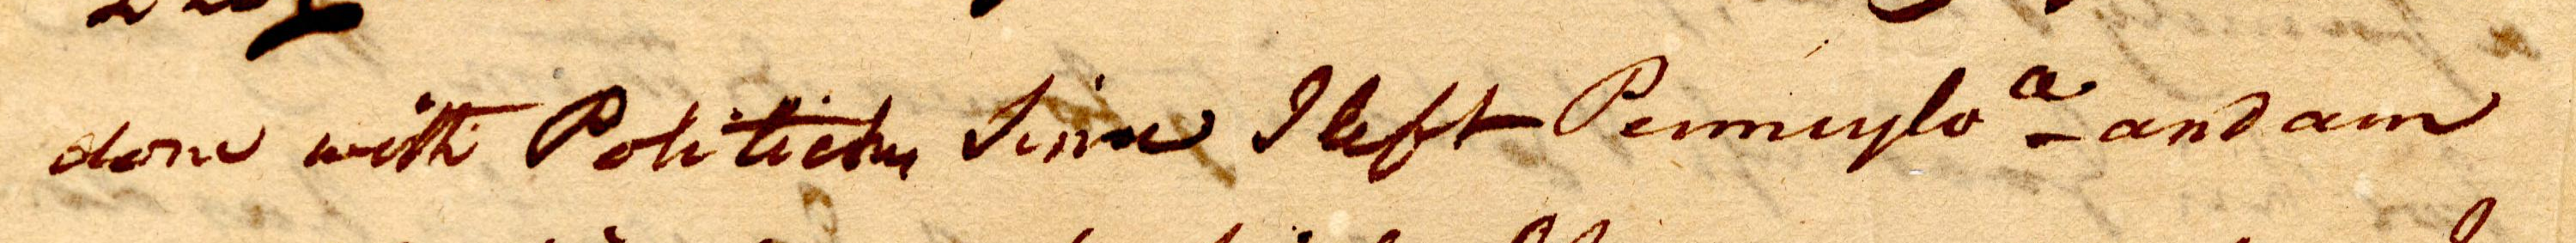done with Politicks Since I left Pennsylv^a. and am
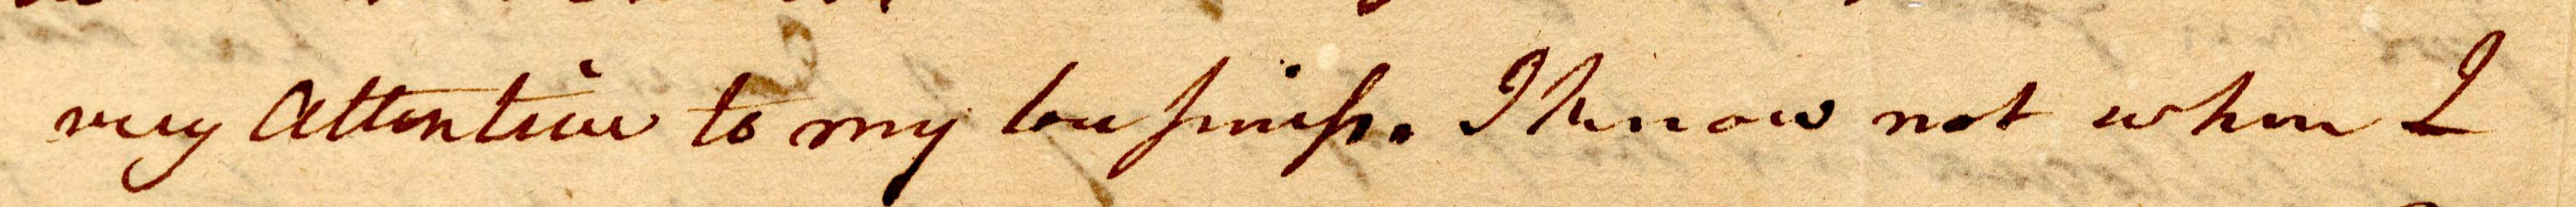very Attentive to my business. I know not when I
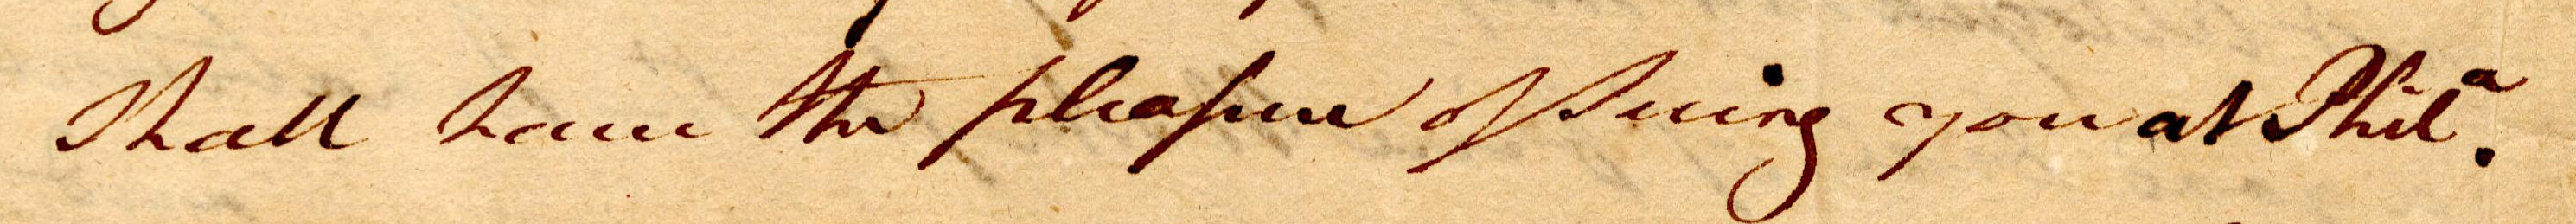shall have the pleasure of Seeing you at Phil^a
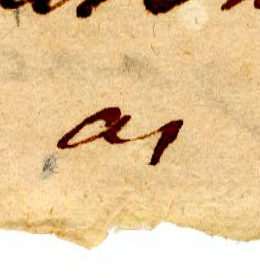as
